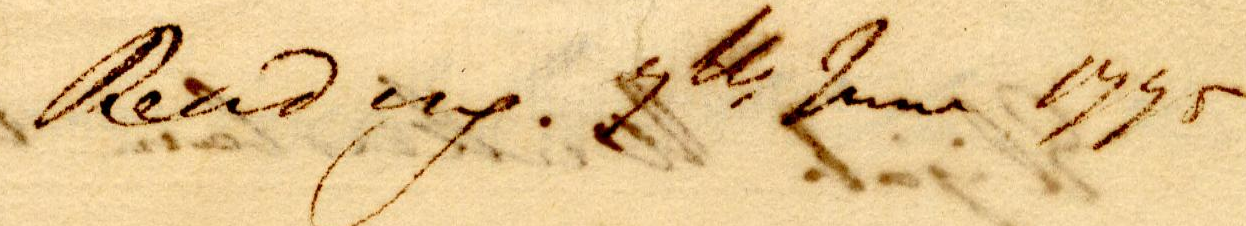Reading. 7^th June. 1775.
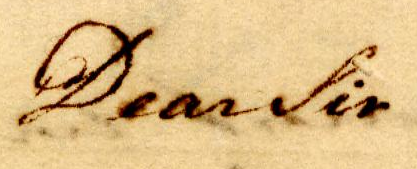Dear Sir
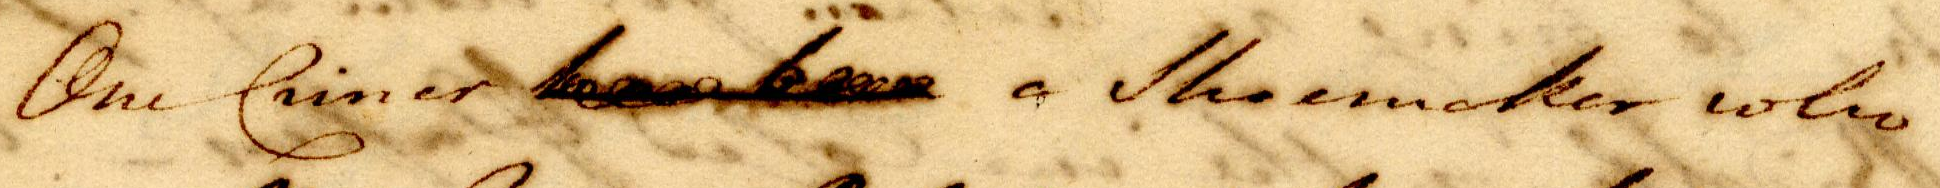One Criner [_______] a Shoemaker who
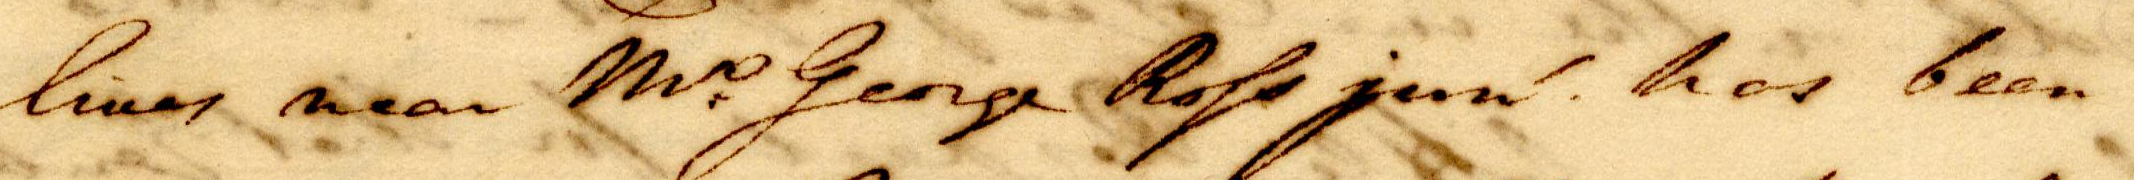lives near M^rs. George Ross jun^r. has been
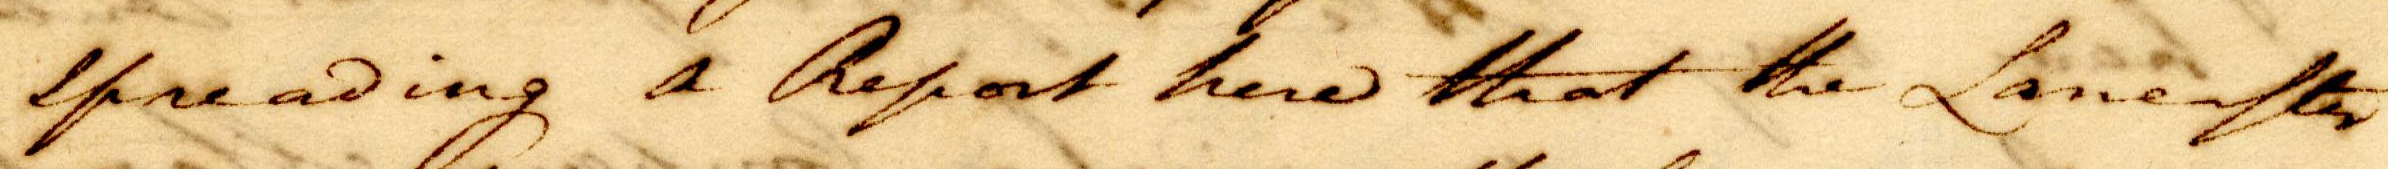spreading a Report here that the Lancaster
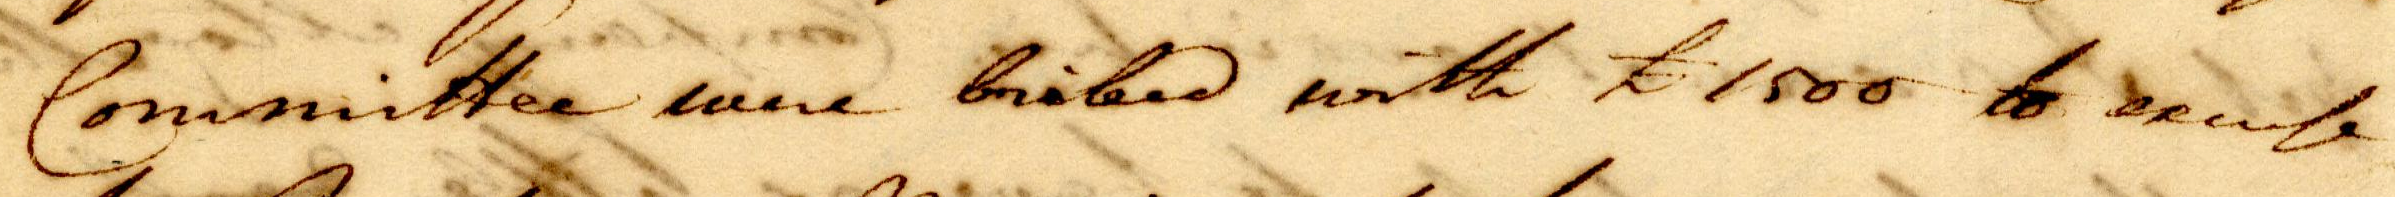Committee were bribed with £1500 to excuse
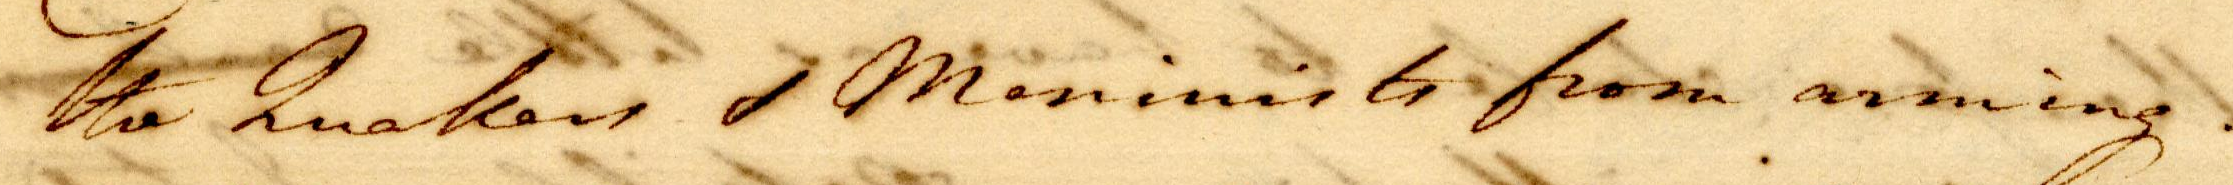the Quakers & Meninists from arming
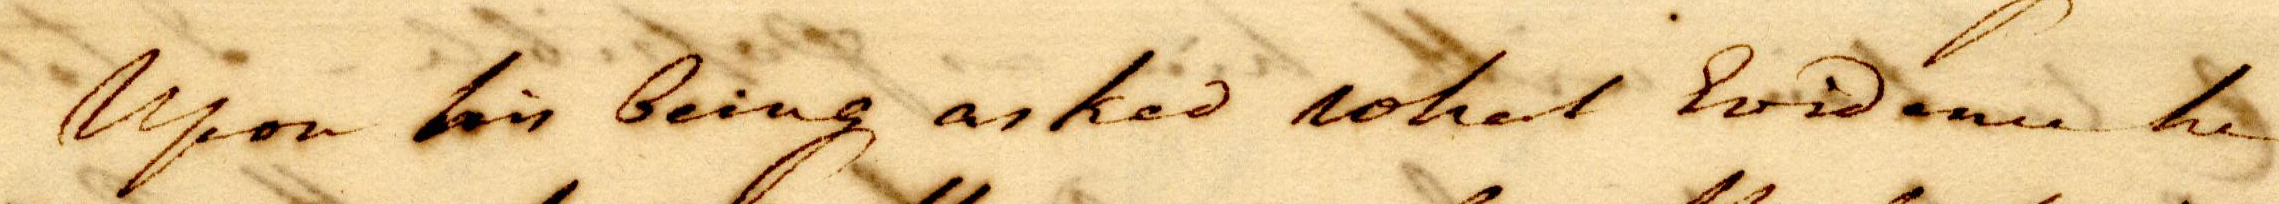Upon his being asked what Evidence he
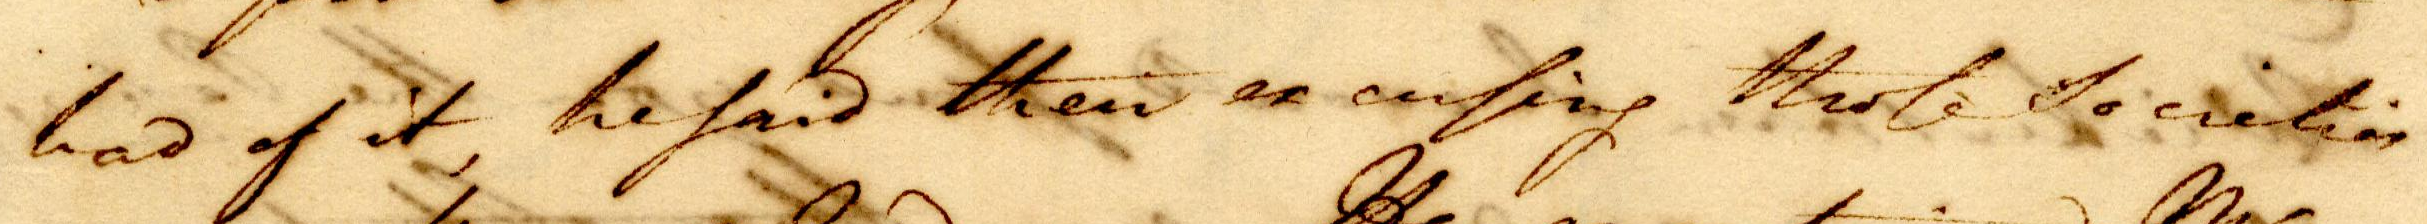had of it, he said their excusing those societies
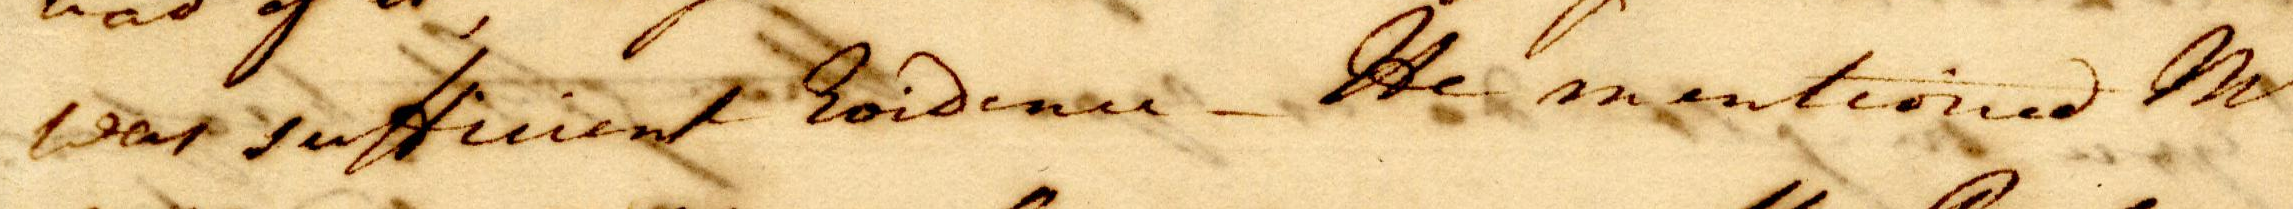was sufficient Evidence. He mentioned M^r
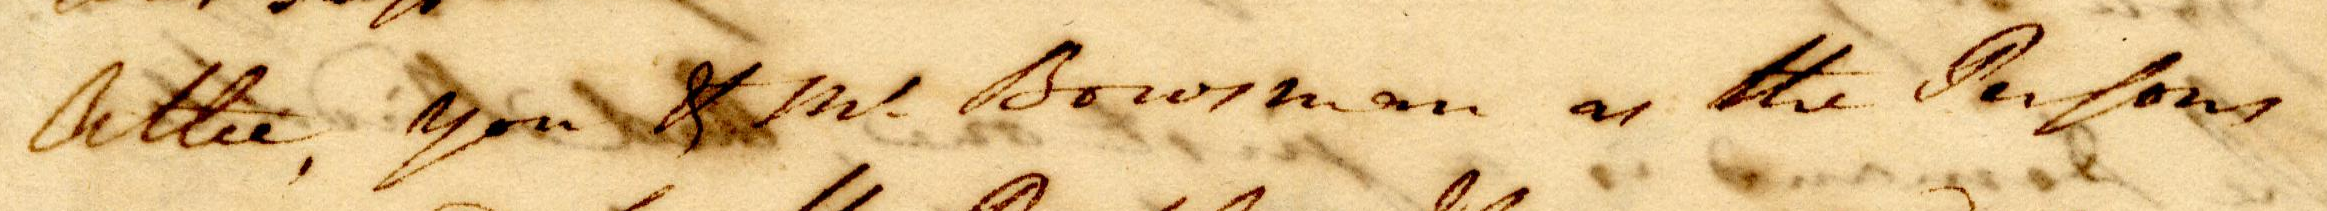Atlee, You & M^r Bowsman as the Persons
